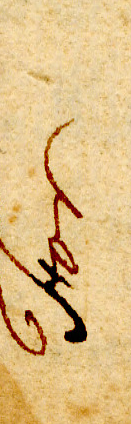For
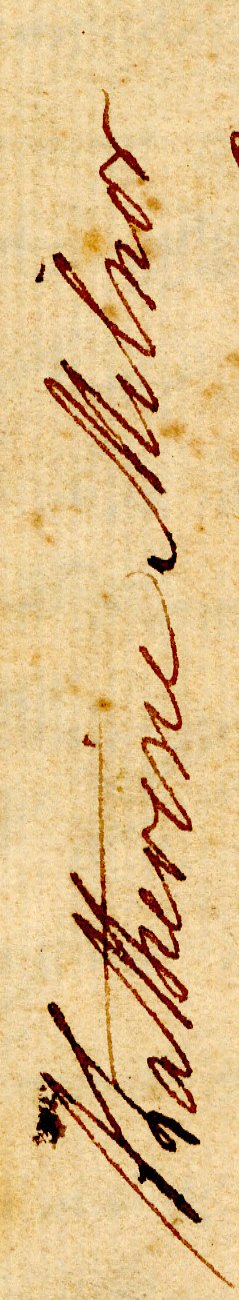Katherine Milnor
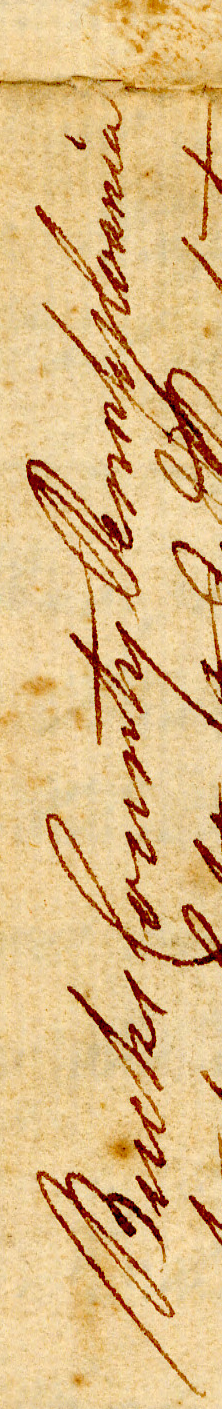Bucks County Pennsylvania
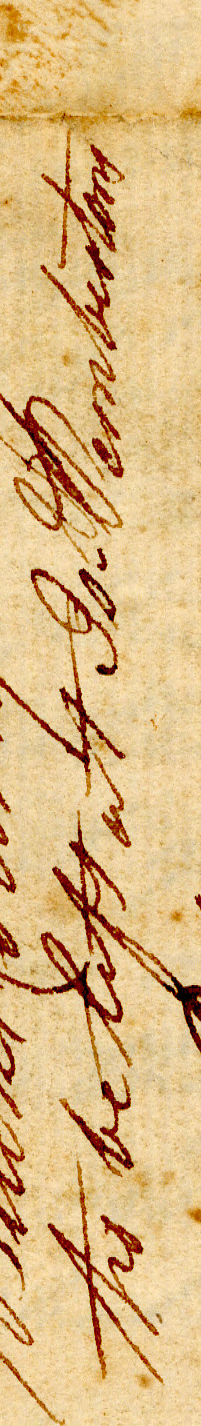to be left at Is^l. Pembertons
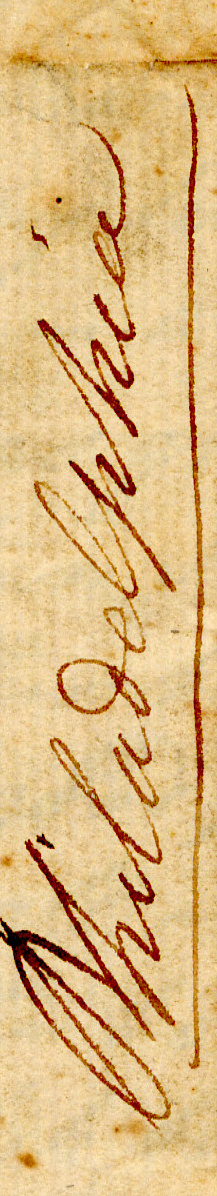Philadelphia
